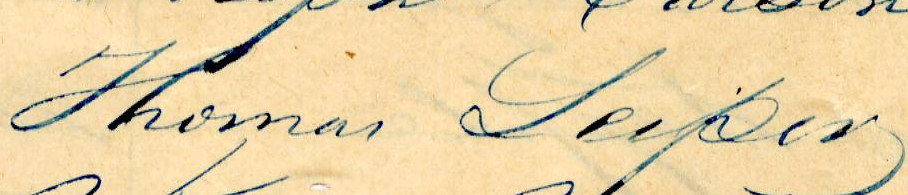Thomas Leiper
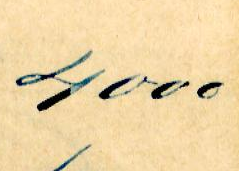4000
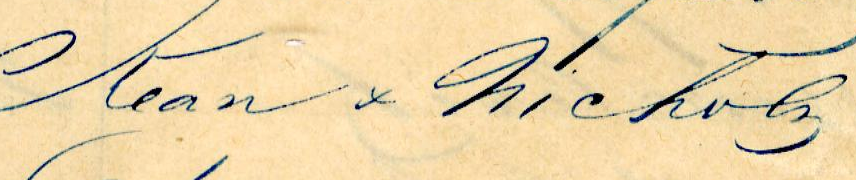Kean & Nichols
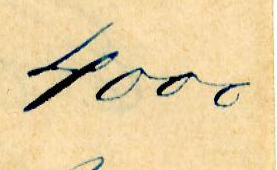4000
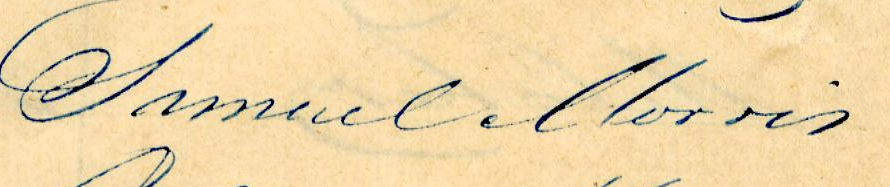Samuel Morris
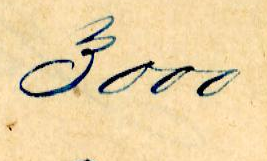3000
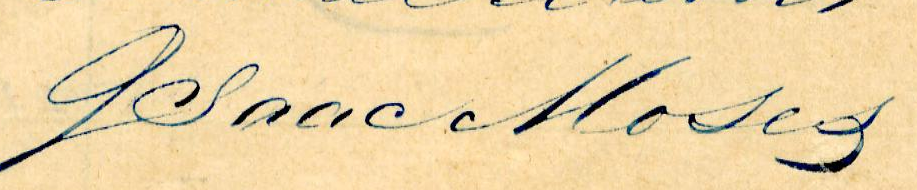Isaac Moses
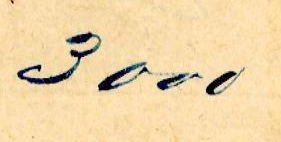3000
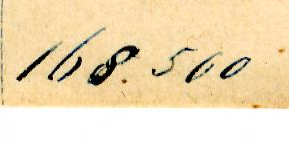168.560
